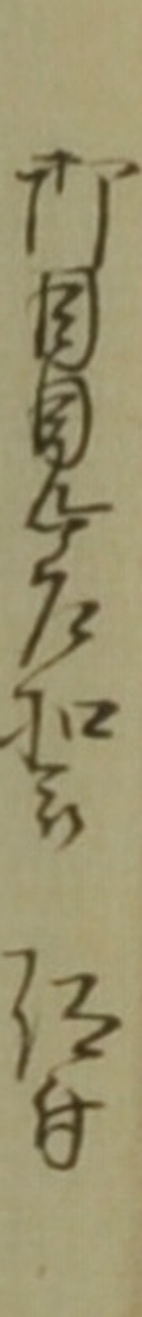御目見差控被仰付
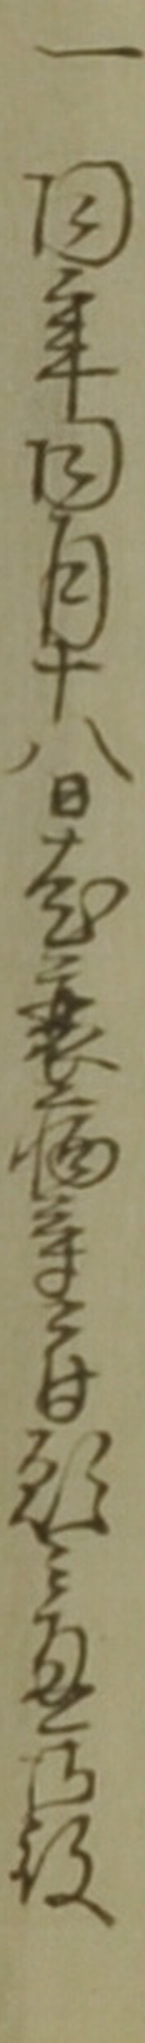一同年同月十八日老衰病気ニ付願之通御役
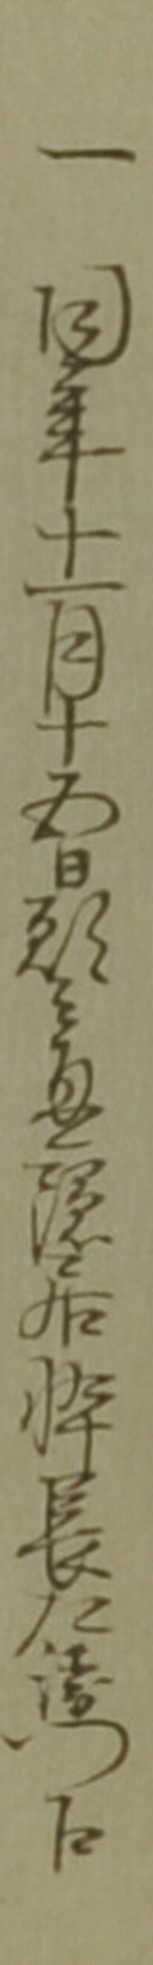一同年十一月十五日願之通隠居忰長左衛門江
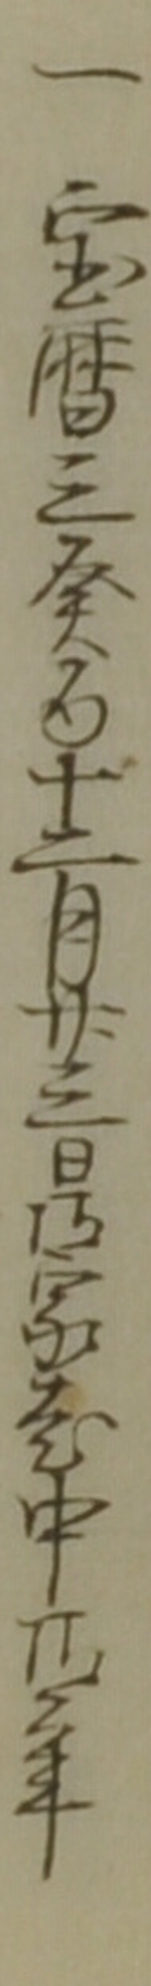一宝暦三癸酉十二月廿三日御家老中御年
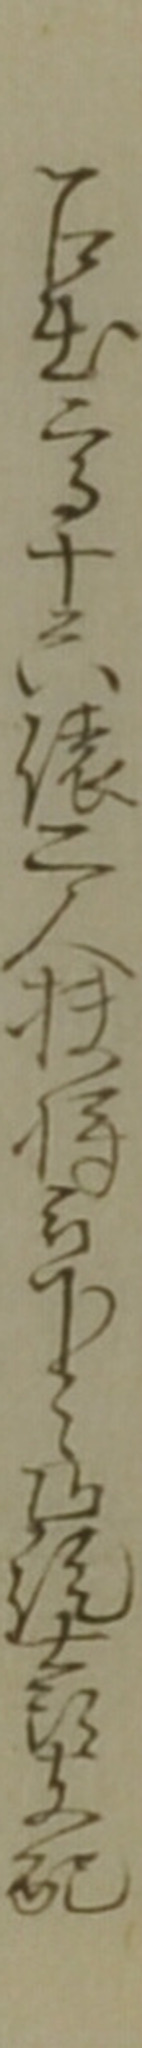召出高十六俵二人扶持被下之御徒士頭支配
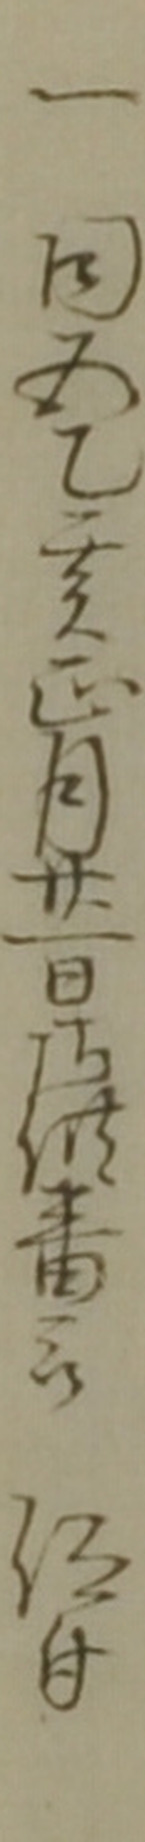一同五乙亥正月廿一日御供番被仰付
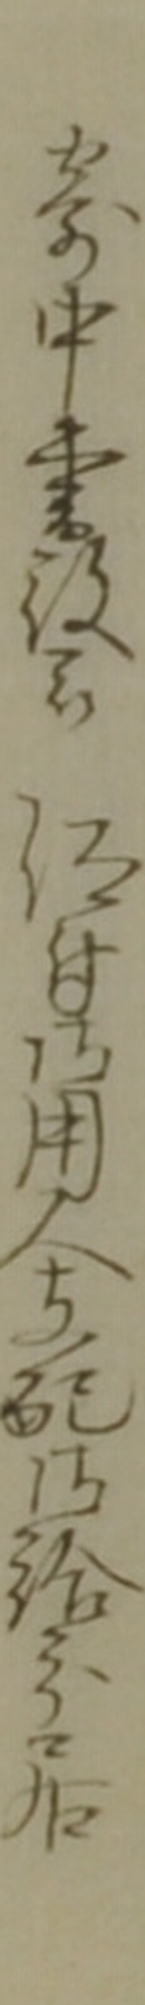寄中書役被仰付御用人支配御給分居
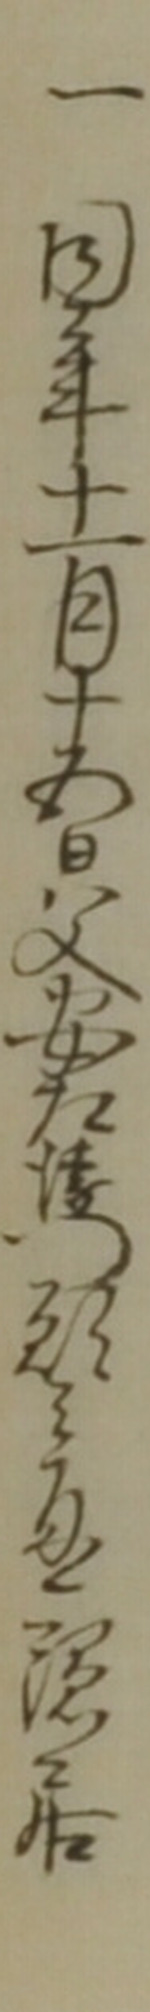一同年十一月十五日父安左衛門願之通隠居
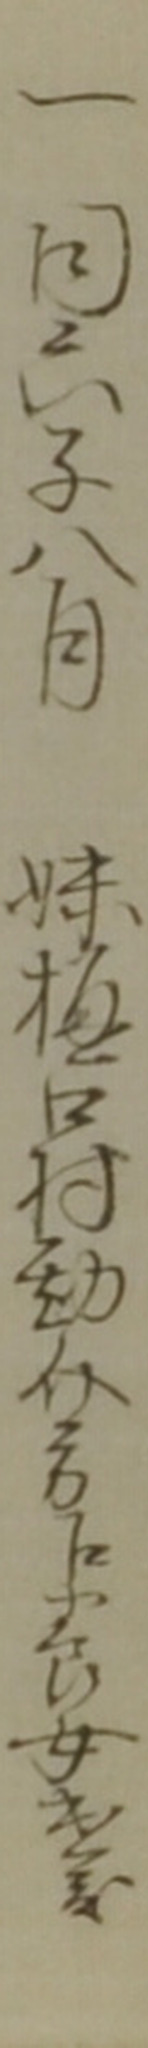一同六子八月妹樋口村勘介方江養女遣度
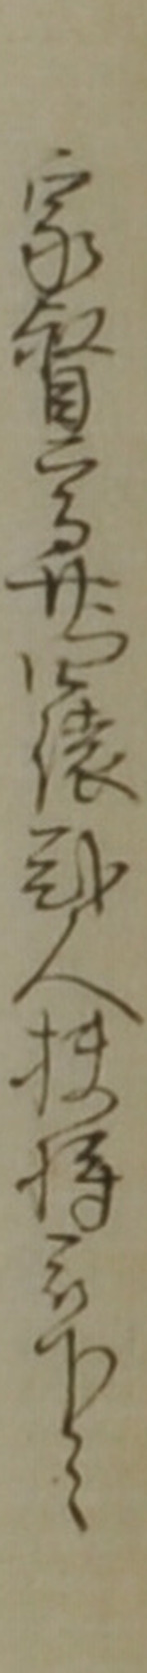家督高廿四俵弐人扶持被下之
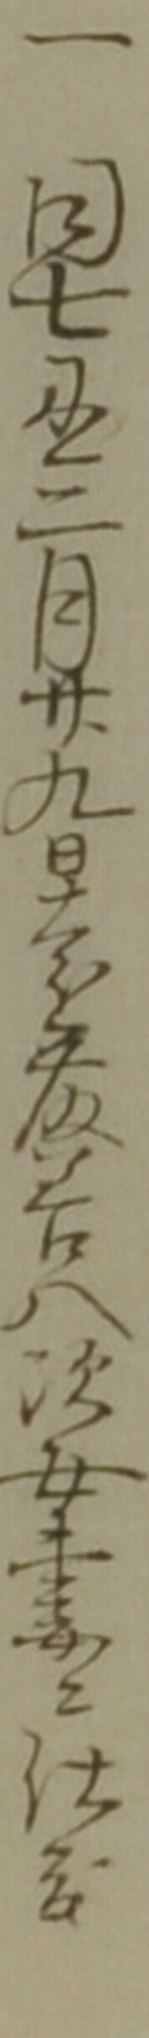一同七丑二月廿九日遠藤善八次女妻ニ仕度
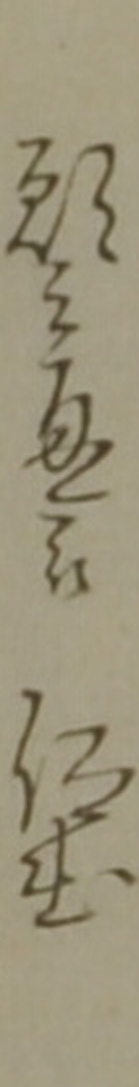願之通被仰出
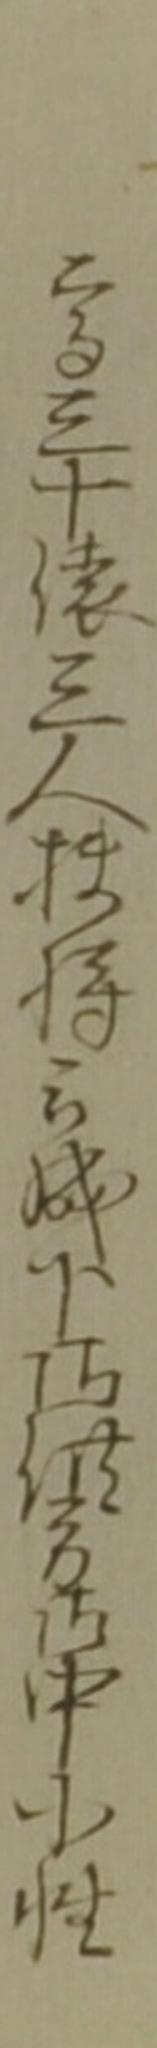高三十俵三人扶持被成下御供方御中小性
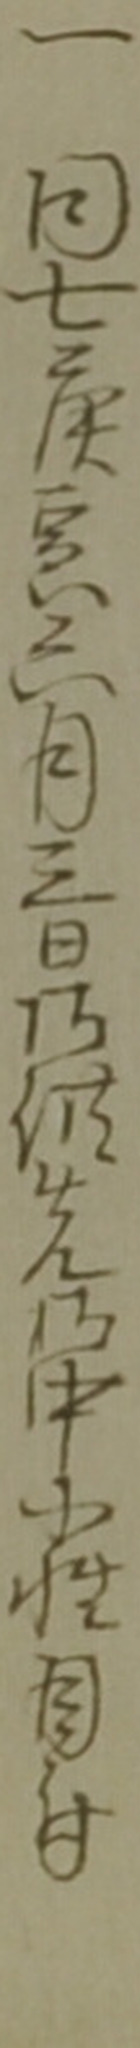一同七庚寅六月三日御供先御中小性目付
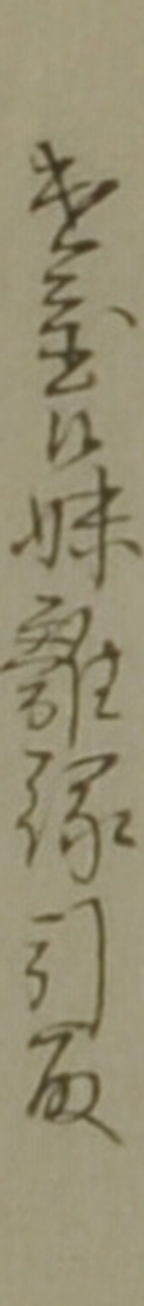遣置候妹離縁引殿
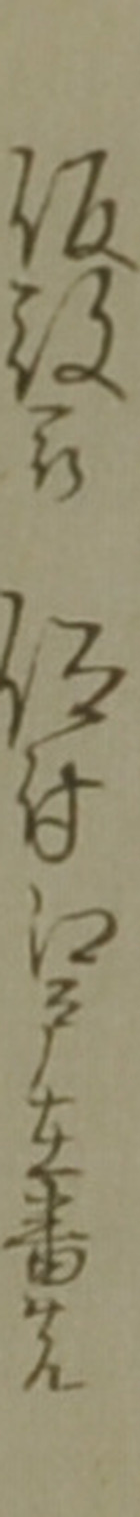仮役被仰付江戸在番先
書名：無足廃家（壱）
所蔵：伊那市立高遠町図書館・合同会社AMANE
